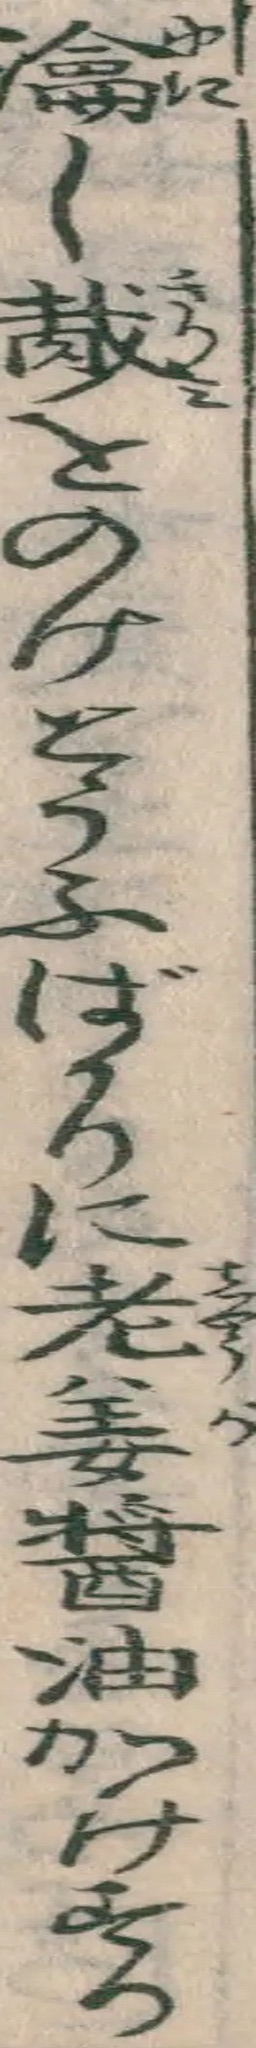瀹し胾をのけとうふばかりに老姜醤油かけすり
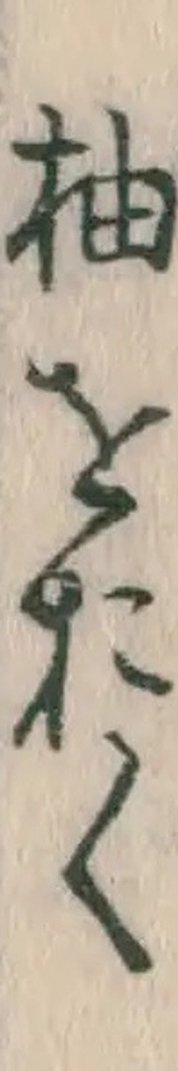柚をおく
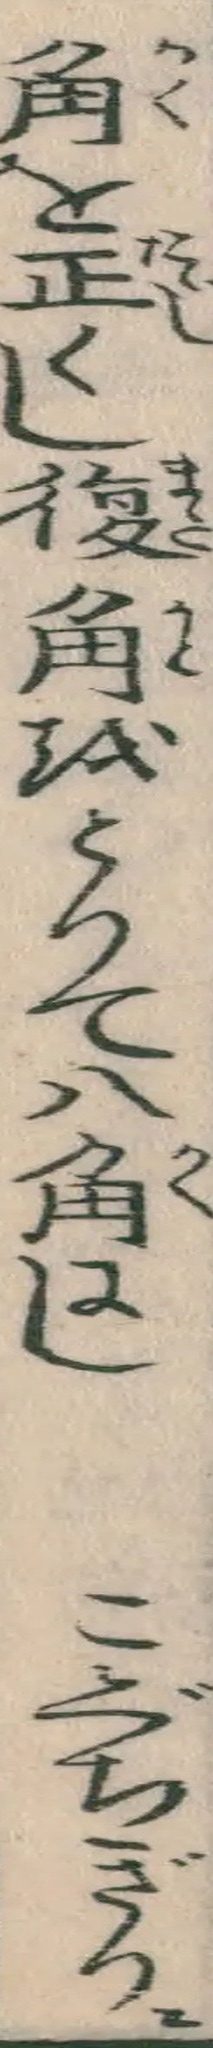角を正くし復角をとりて八角にしこぐちぎりに
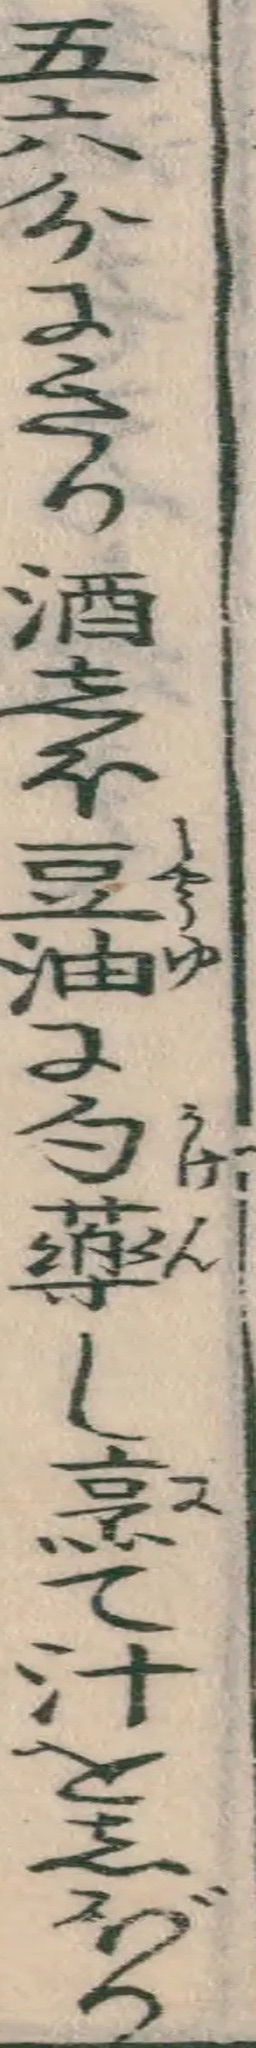五六分にきり酒しほ豆油に勺薬し烹て汁をしぼり
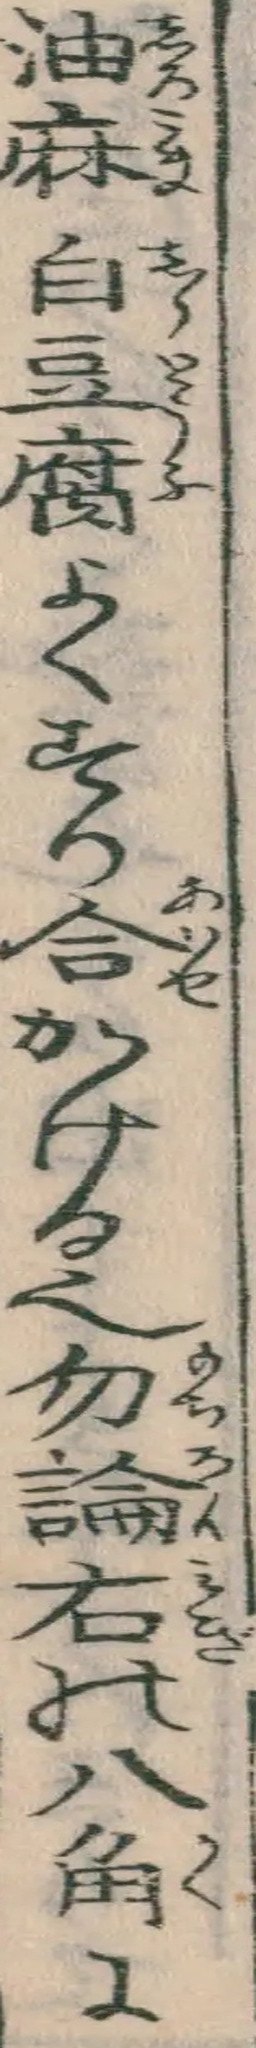油麻白豆腐よくすり合かける也勿論右の八角に
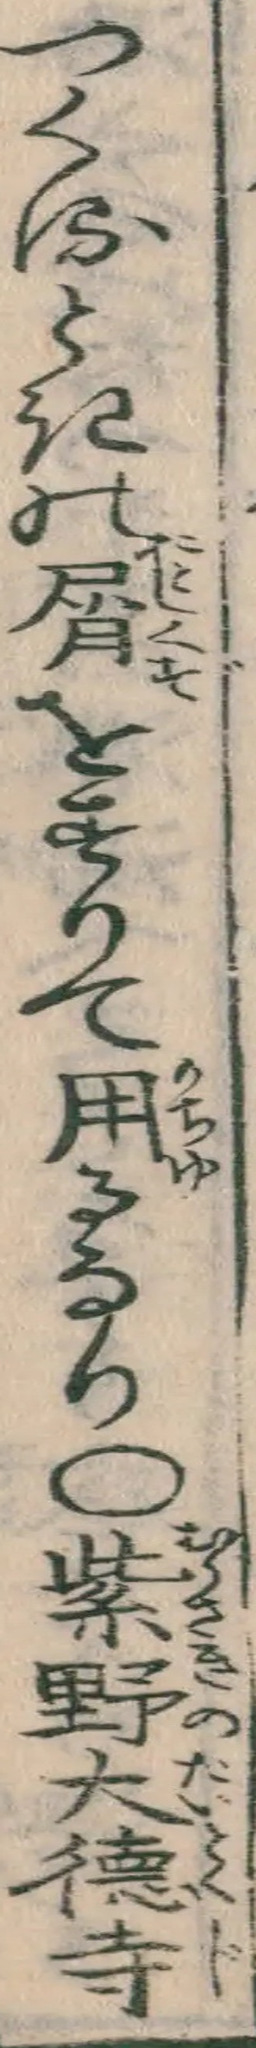つくるときの屑をすりて用るなり○紫野大徳寺
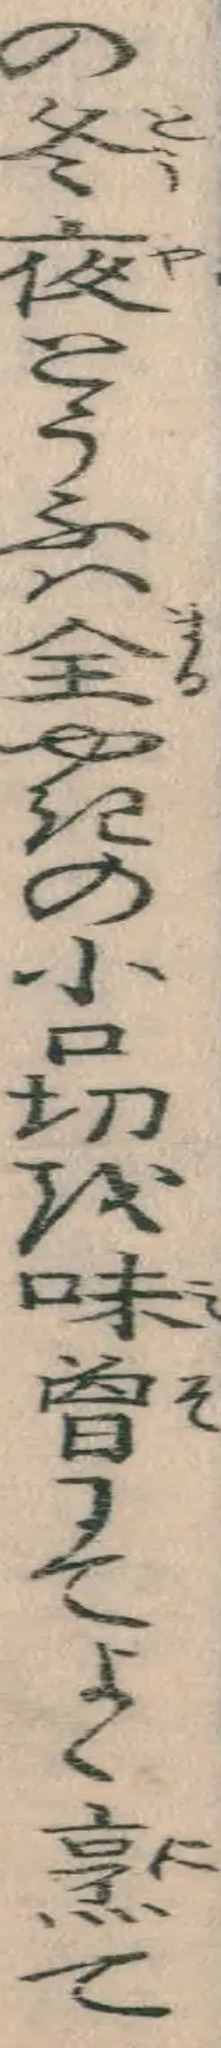の冬夜とうふは全ゆきの小口切を味曾にてよく烹て
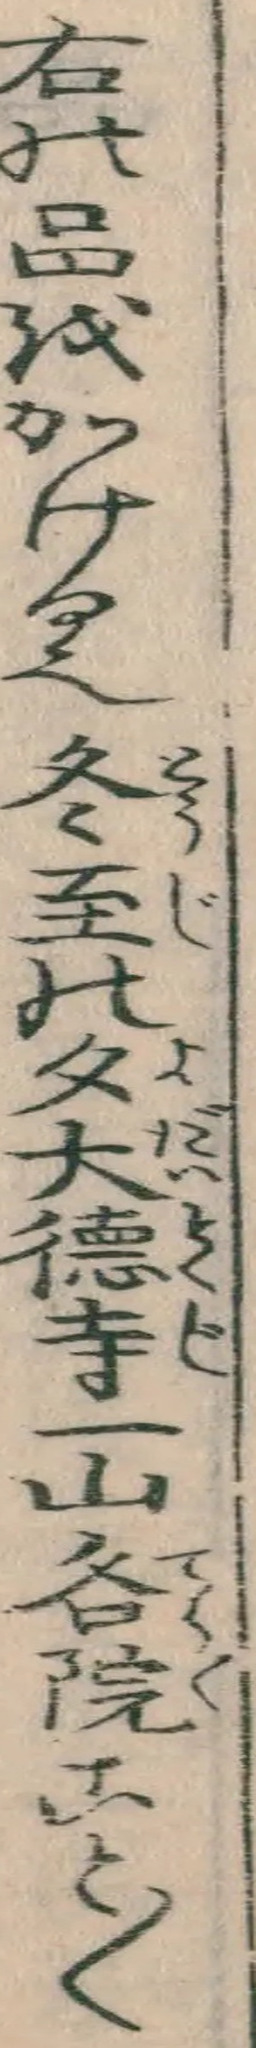右の品をかける也冬至の夕大徳寺一山各院こと〳〵
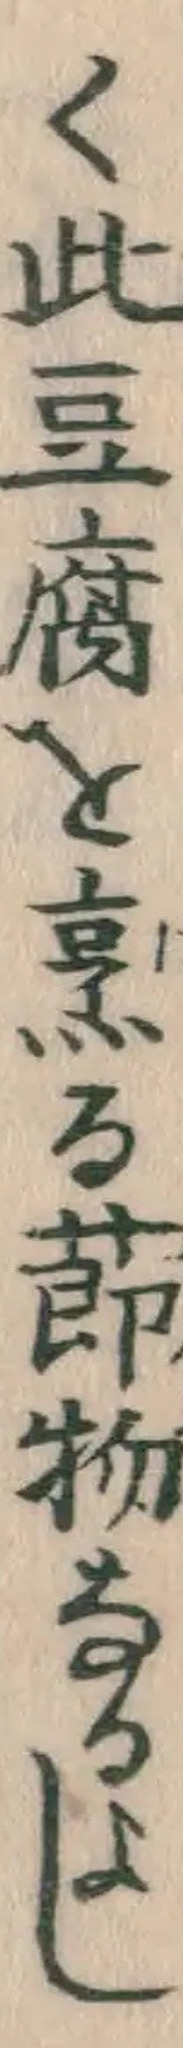く此豆腐を烹る節物なるよし
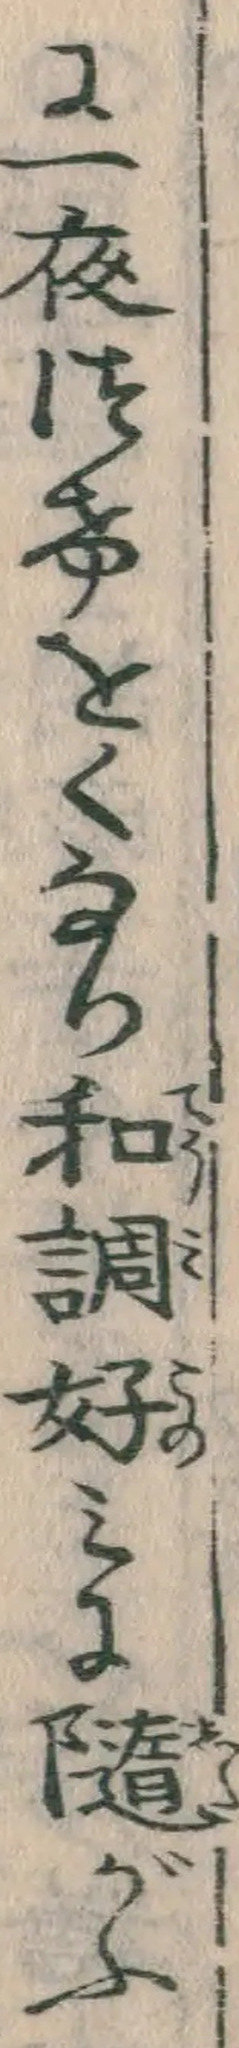に一夜つけをくなり和調好みに随がふ
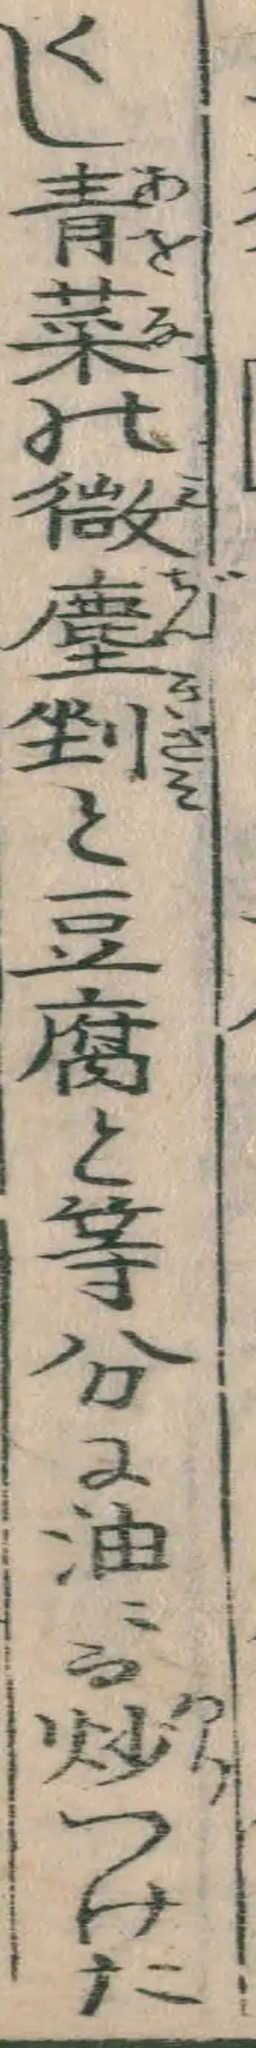くし青菜の微塵剉と豆腐と等分に油にて炒つけた
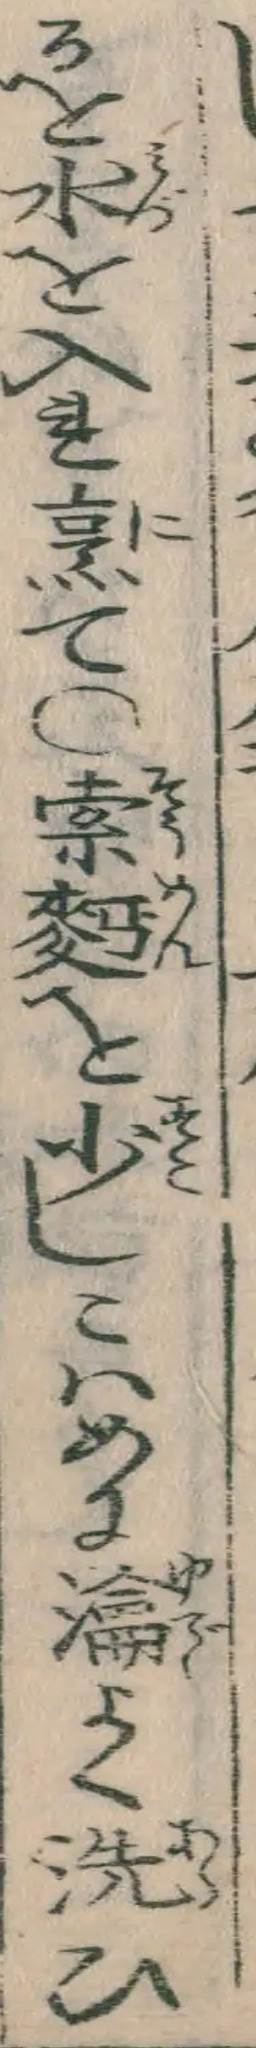るを水を入れ烹て○索麪を少しこはめに瀹よく洗ひ

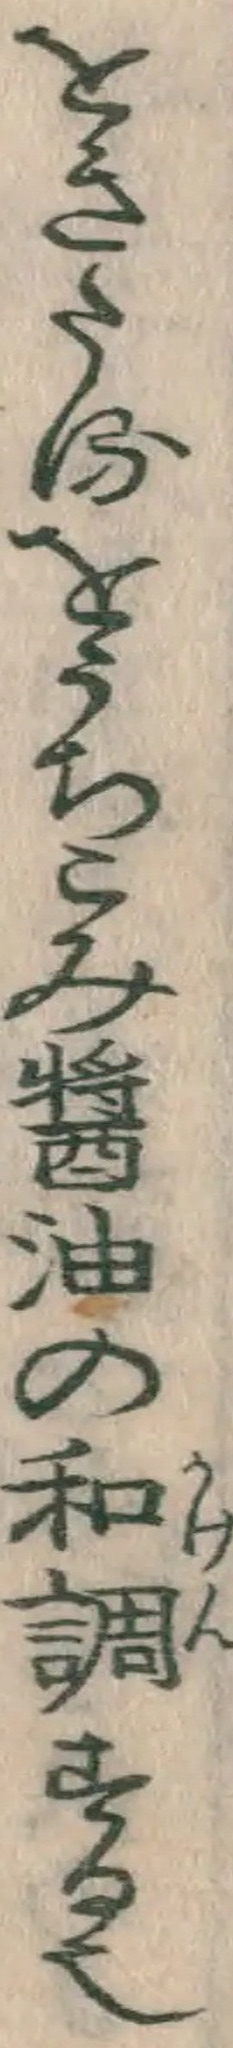をきたるをうちこみ醤油の和調する也
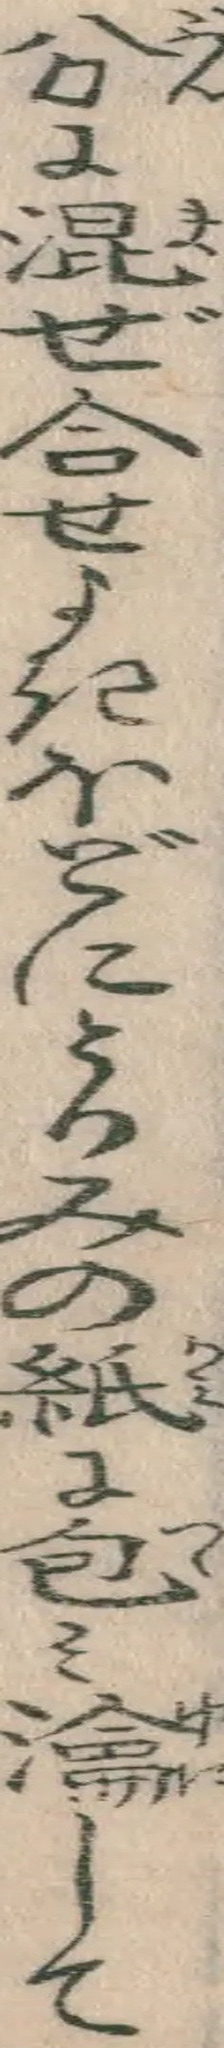分に混ぜ合せよきほどにとりみの紙に包み瀹して
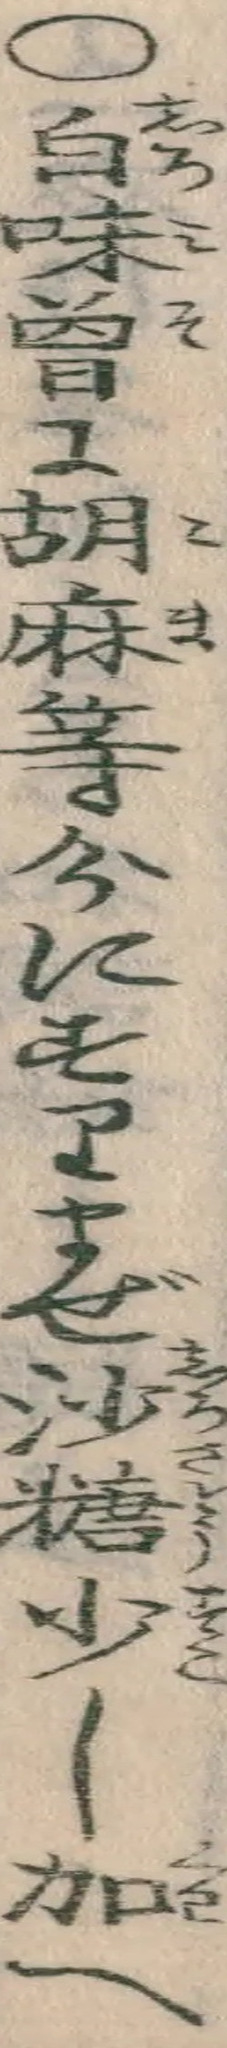○白味噌に胡麻等分にすりまぜ沙糖少し加へ
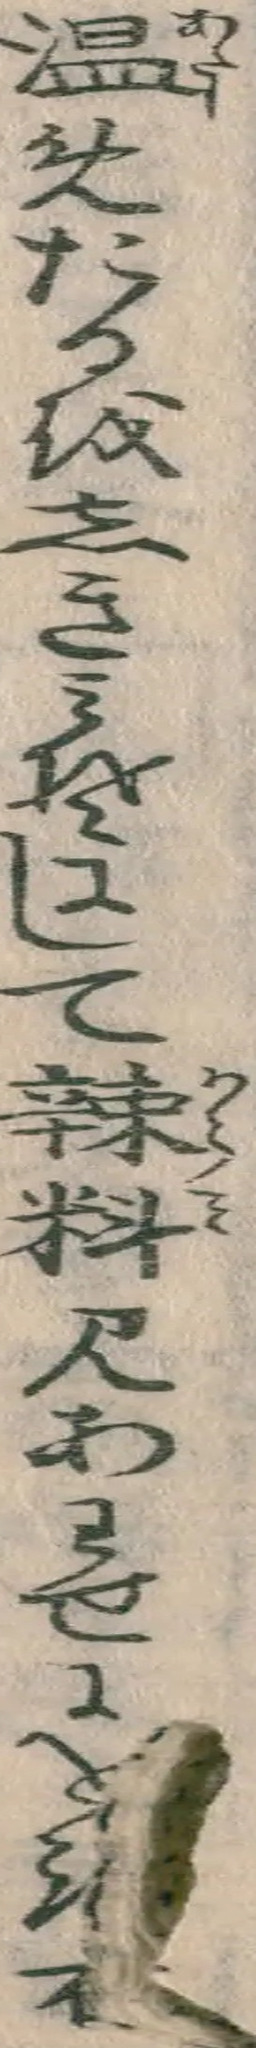温めたるをしきみそにして辣料みあわせにをき右
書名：豆腐百珍. [正編]
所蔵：国立国会図書館 National Diet Library, JAPAN
